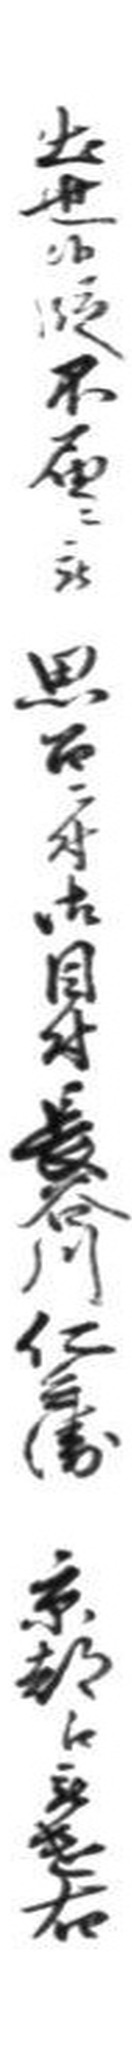出世候段不届ニ被思召ニ付御目付長谷川仁兵衛京都江被遣右
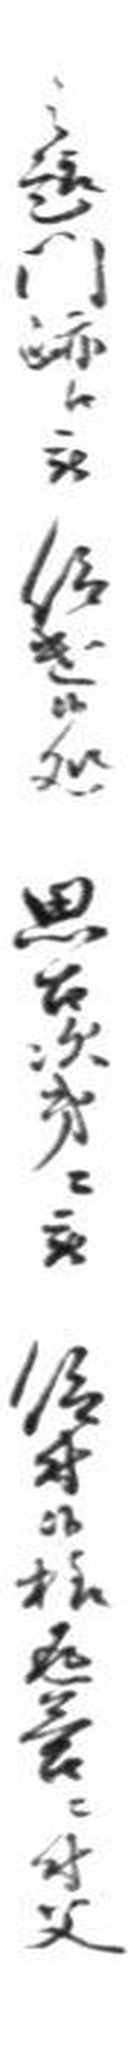之趣門跡江被仰遣候処思召次第ニ被仰付候様返答ニ付父
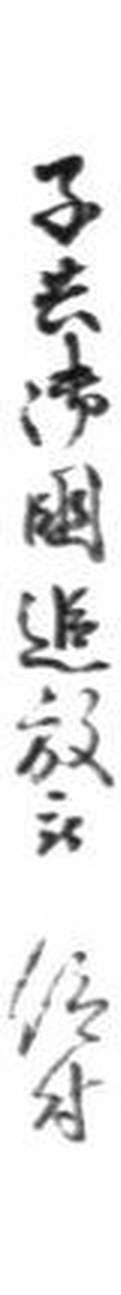子共御国追放被仰付
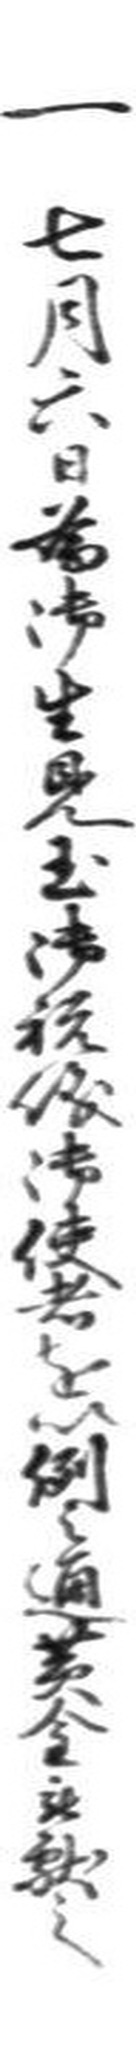一七月六日為御生見玉御祝儀御使者を以例之通黄金被献之
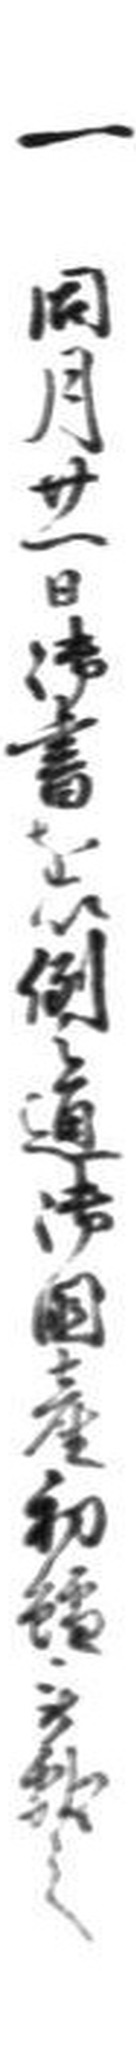一同月廿一日御書を以例之通御国産初鱈被献之
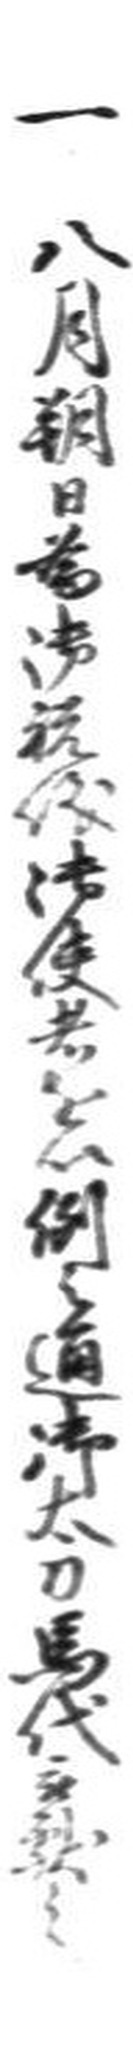一八月朔日為御祝儀御使者を以例之通小太刀馬代被献之
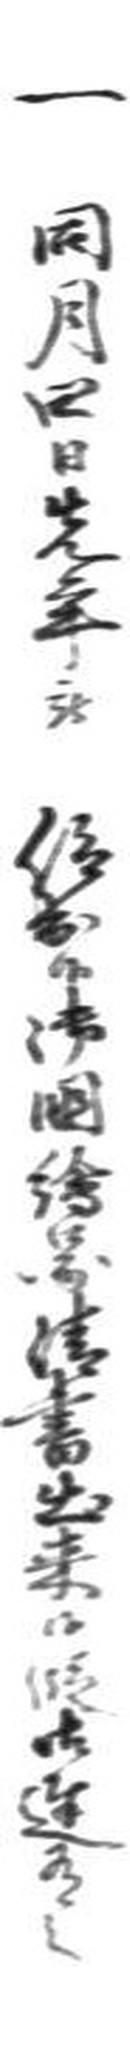一同月四日先年被仰出候御国絵図清書出来候段御達有之
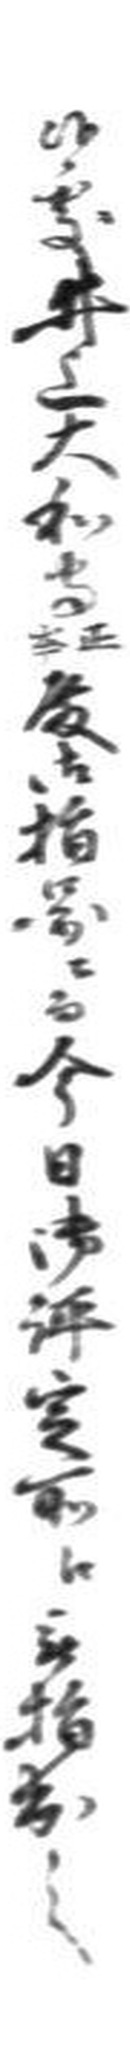候処井上大和守正峯殿御指図ニ而今日御評定所江指出之

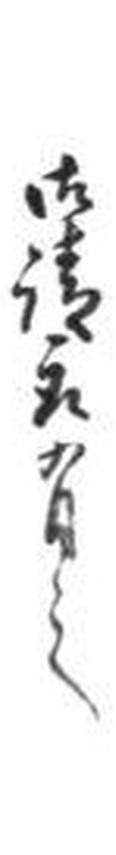御請取有之
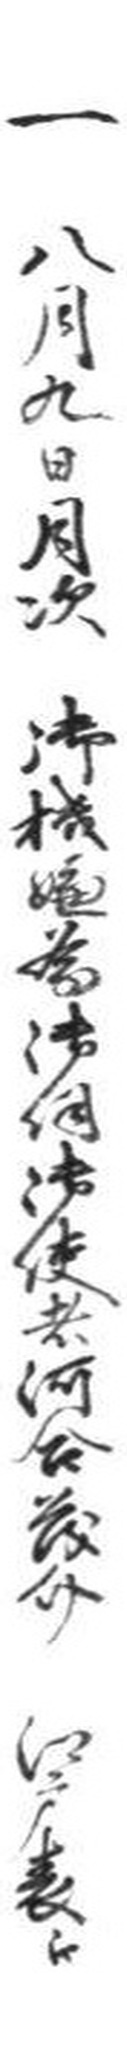一八月九日月次御機嫌為御伺御使者河合茂介江戸表江
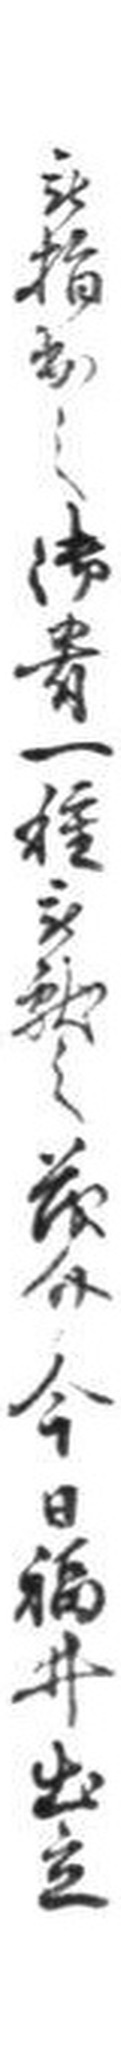被指出之御肴一種被献之茂介今日福井出立
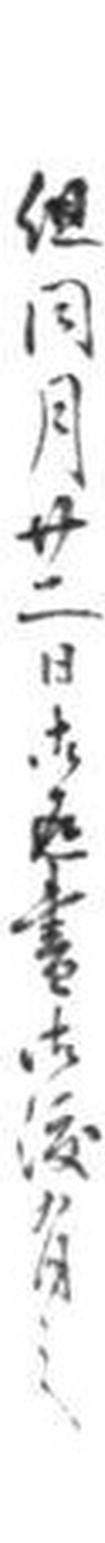但同月廿二日御返書御渡有之
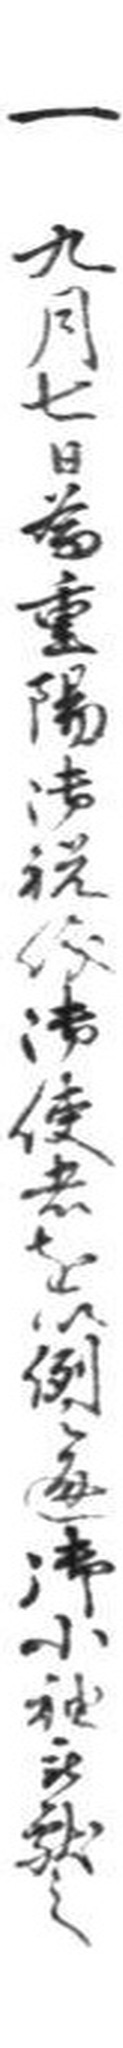一九月七日為重陽御祝儀御使者を以例之通御小袖被献之
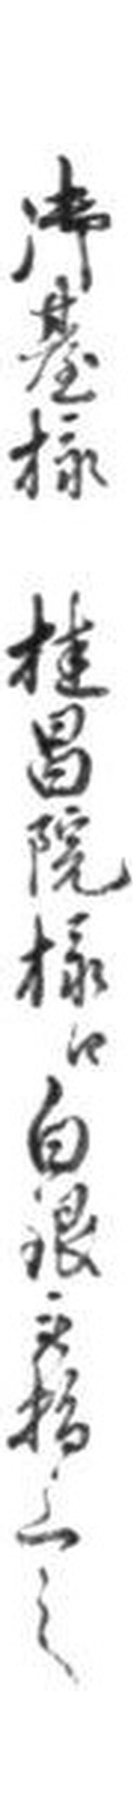御台様桂昌院様江白銀被指上之
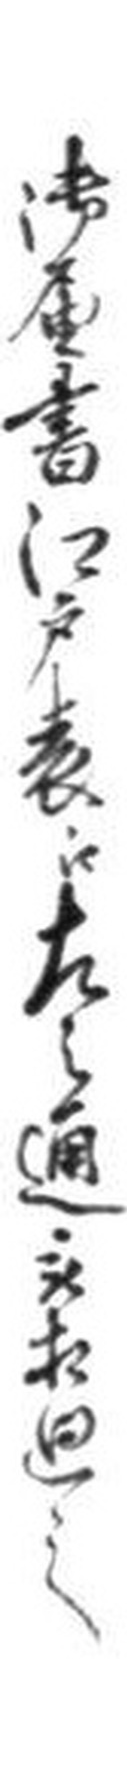御届書江戸表江左之通被相廻之
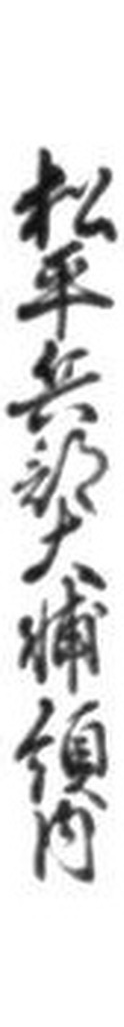松平兵部大輔領内
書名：家譜 二十一 吉品公 従元禄十三年到同十四年
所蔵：福井県文書館 Fukui Prefectural Archives
